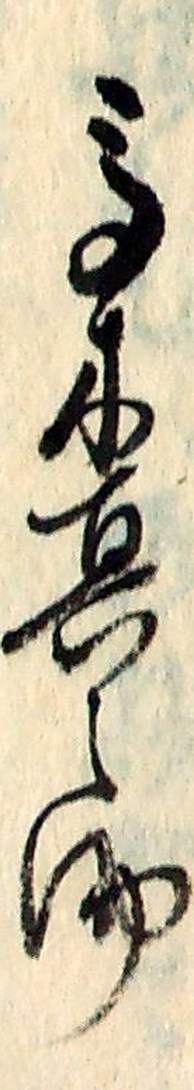高木真之助
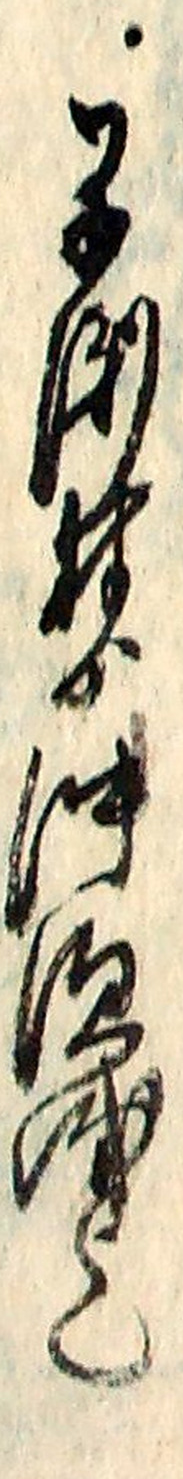早淵村ゟ沖須浦迄
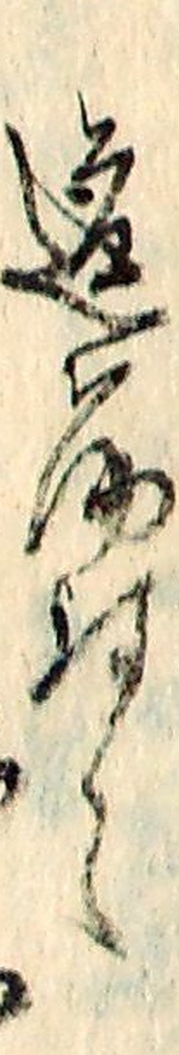道筋村々
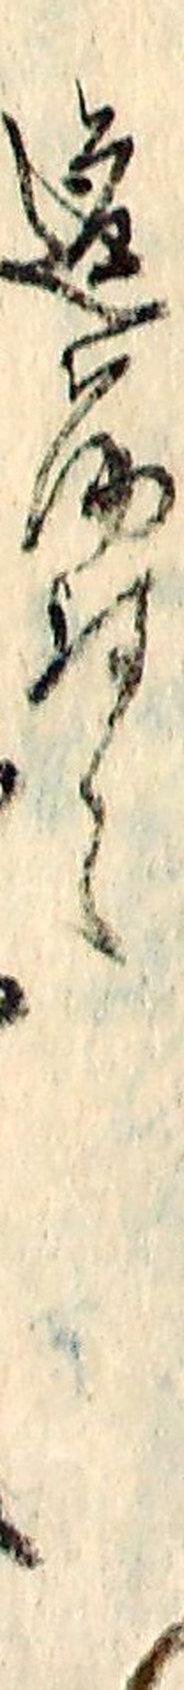道筋村々
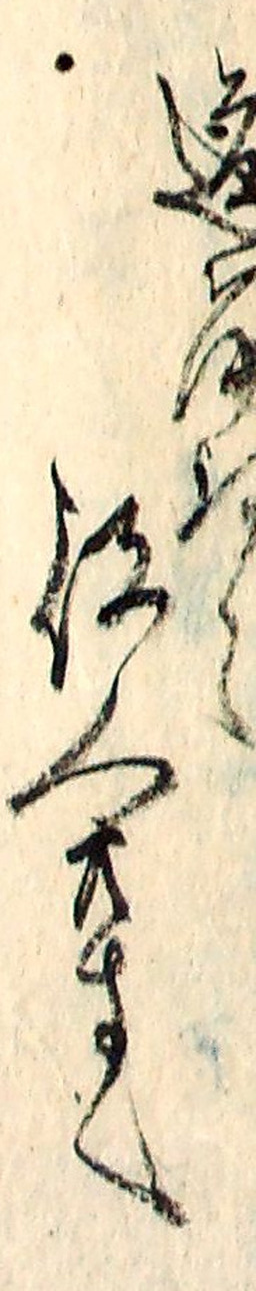役人共方へ
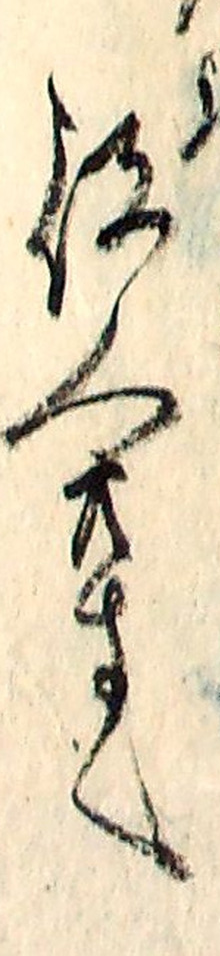役人共方へ

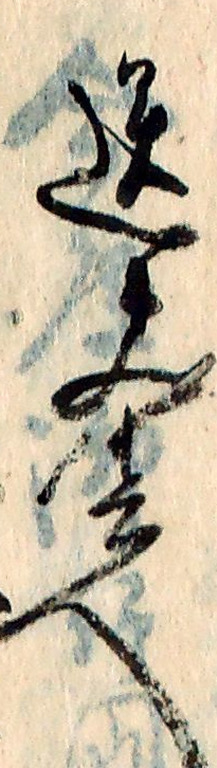送夫壱人
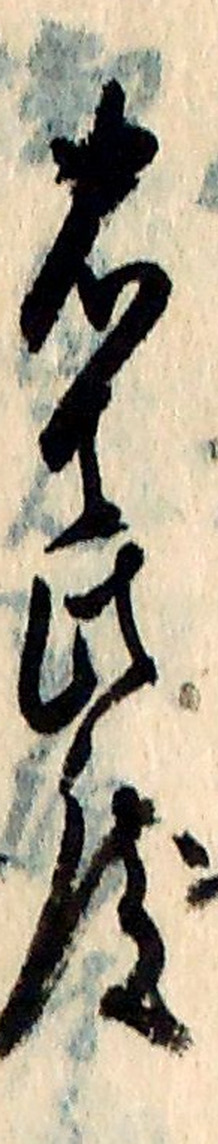右は此度
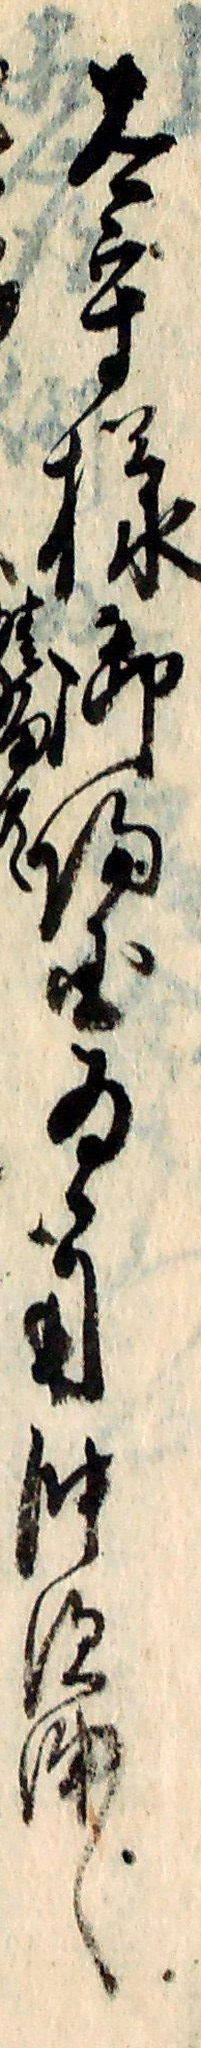太守様御帰国為御用沖須浦へ
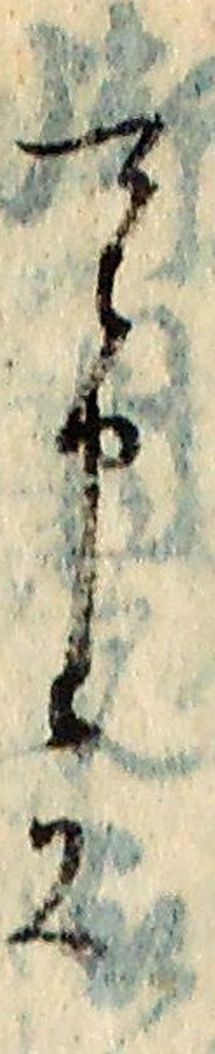可被申候以上
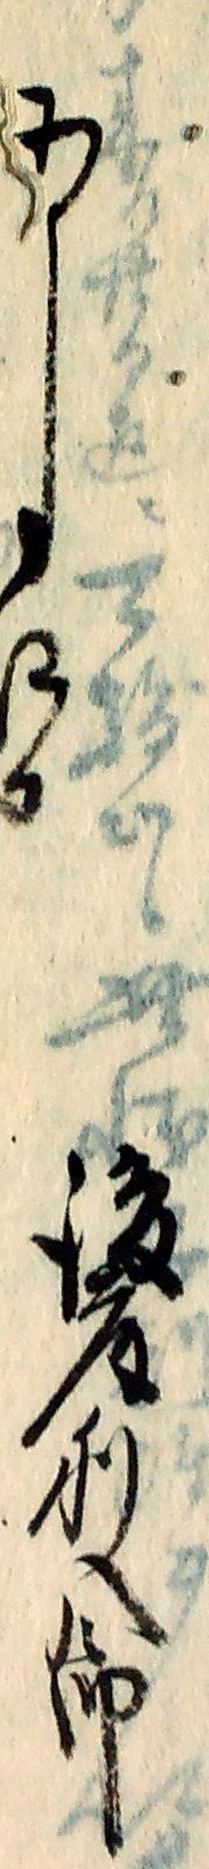五月四日後藤利八郎
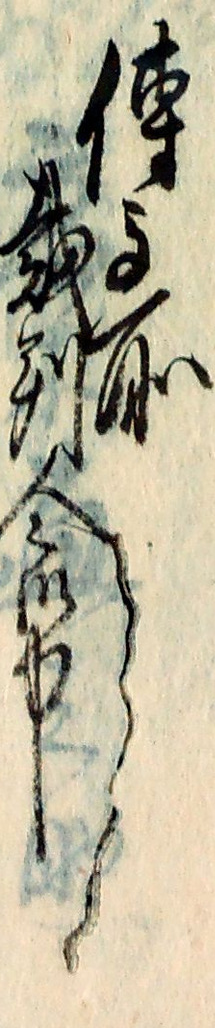伝馬所
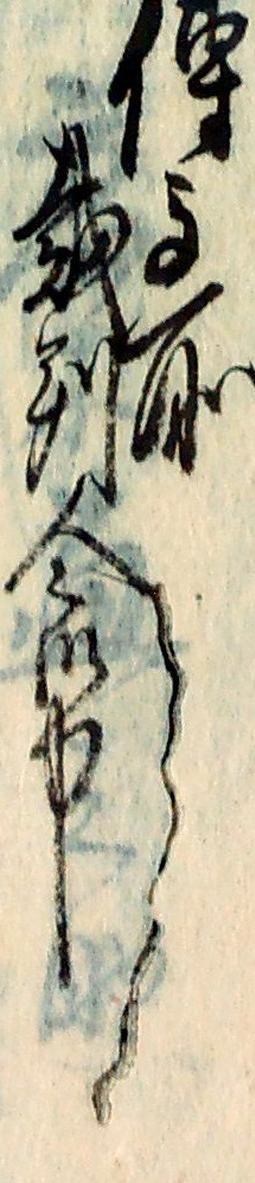裁判人衆中
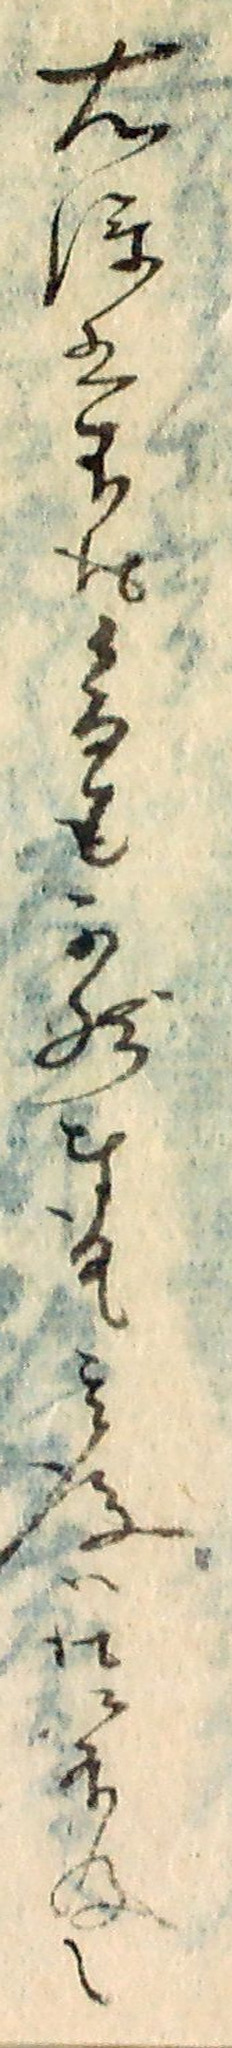右添書不仕候ても可然奉存候其後は仕に不及候

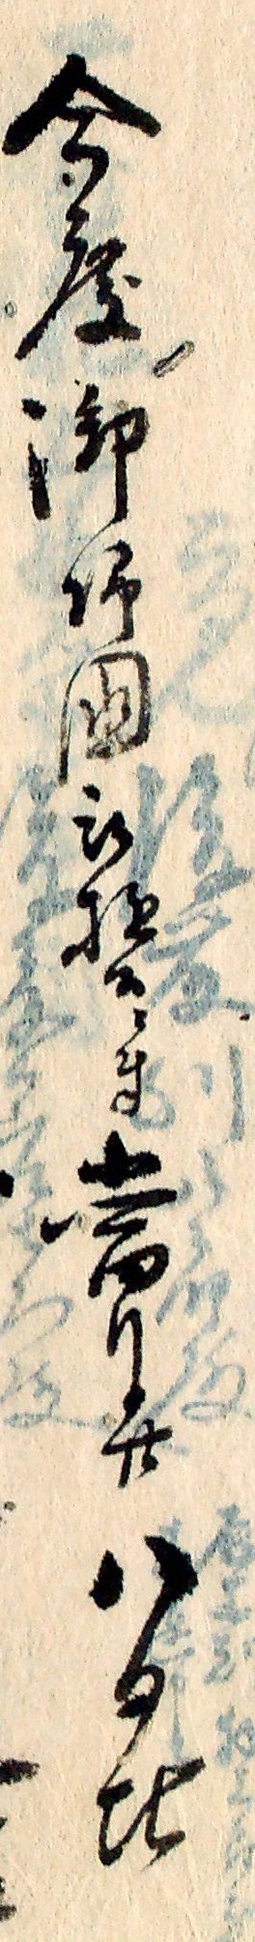今度御帰国被遊候に付当月廿八日比
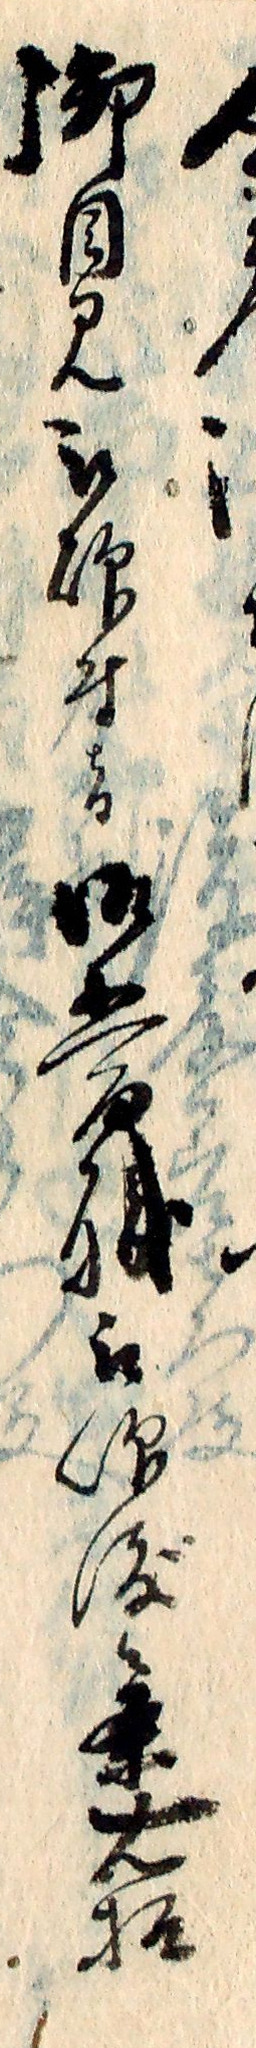御目見被仰付旨御当職被仰渡候条右様
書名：諸御願書控(後藤氏壱番）
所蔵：鳴門教育大学 Naruto University of Education
